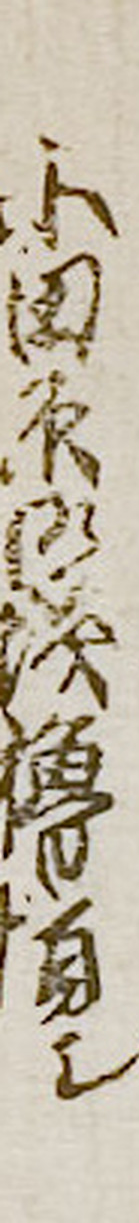小田原御城櫓損し
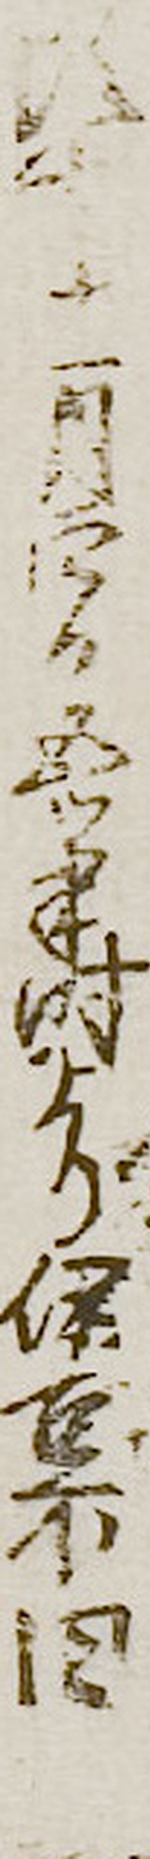頃は十一月四日五ツ半時より伊豆下田
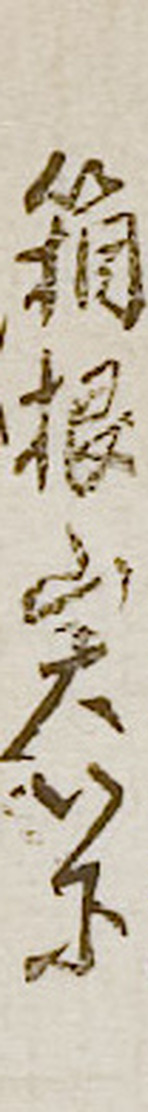箱根山大いに
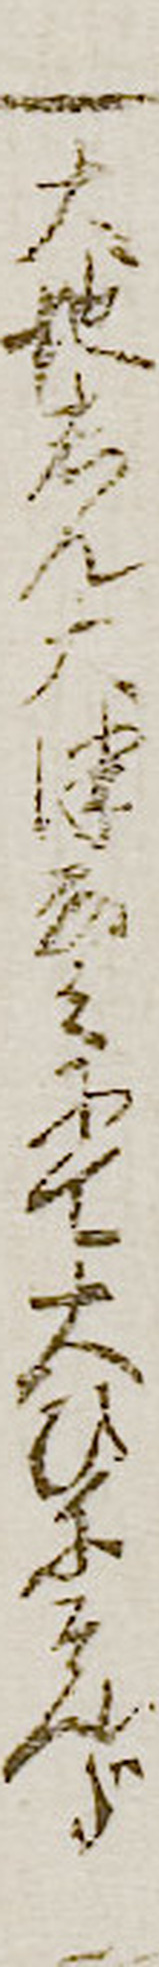大地しん大つなみにて大ひにそんじ
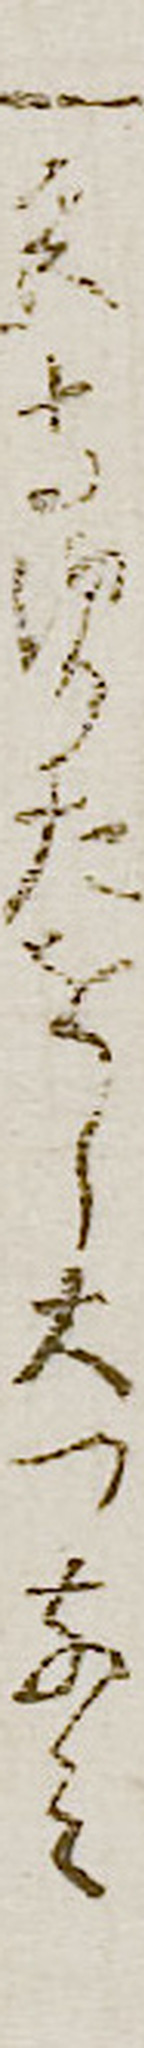宮寺ゆりたをし大つなみ
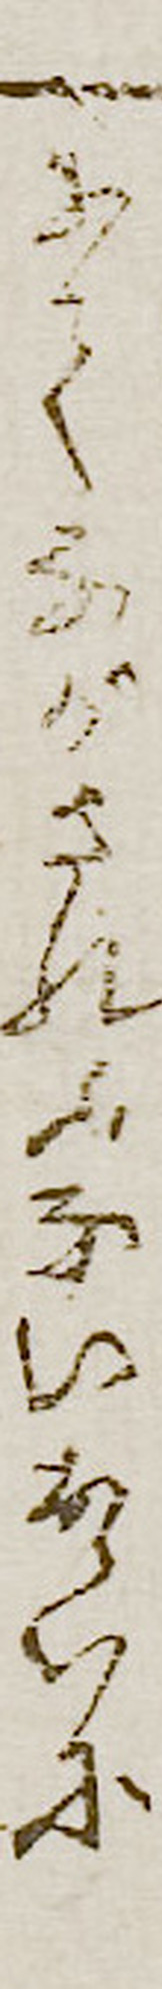にてながされふないおゝいに
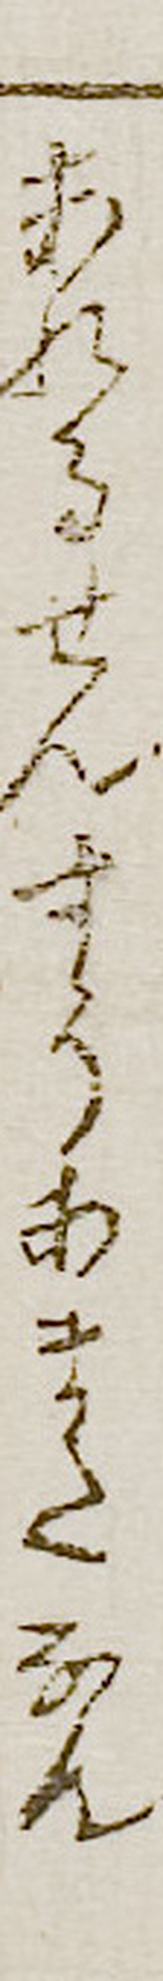あれるせんすうあまたなん
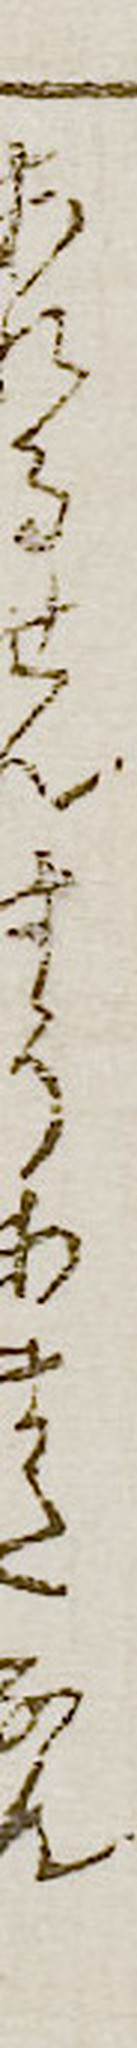あれるせんすうあまたなん
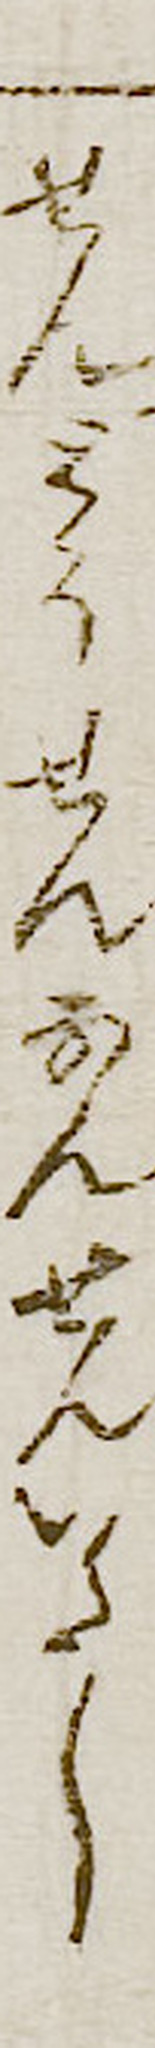せんとうせんなんせんいたし
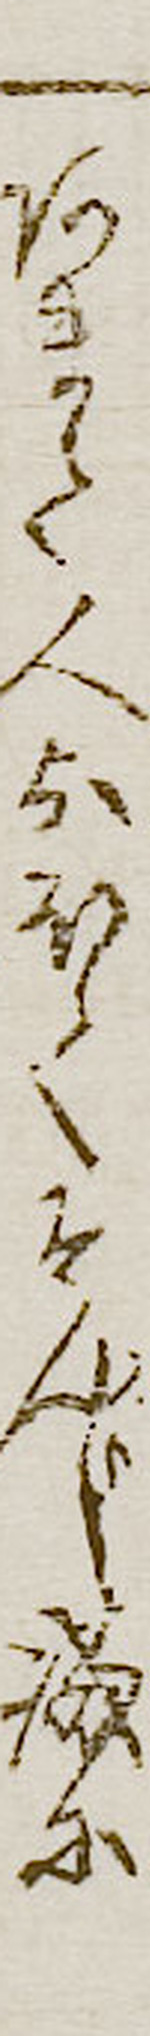あまた人おほくそんじ誠に
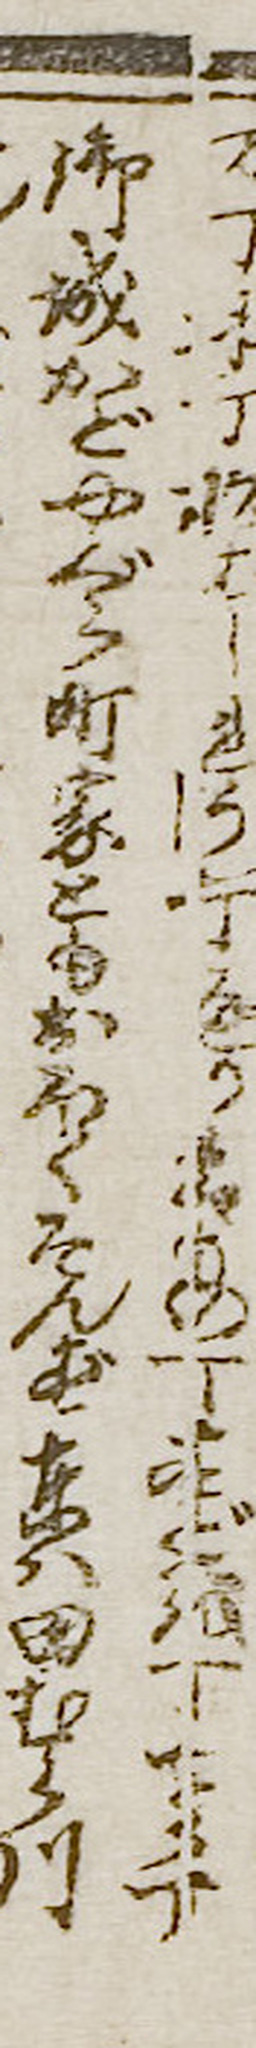御城かどやぐら町家ともおほくそんず東は田むら川
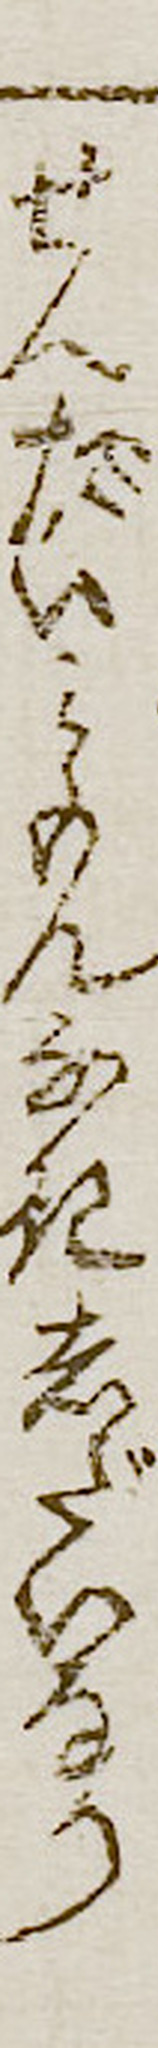せんだいみもんなきしだいなり
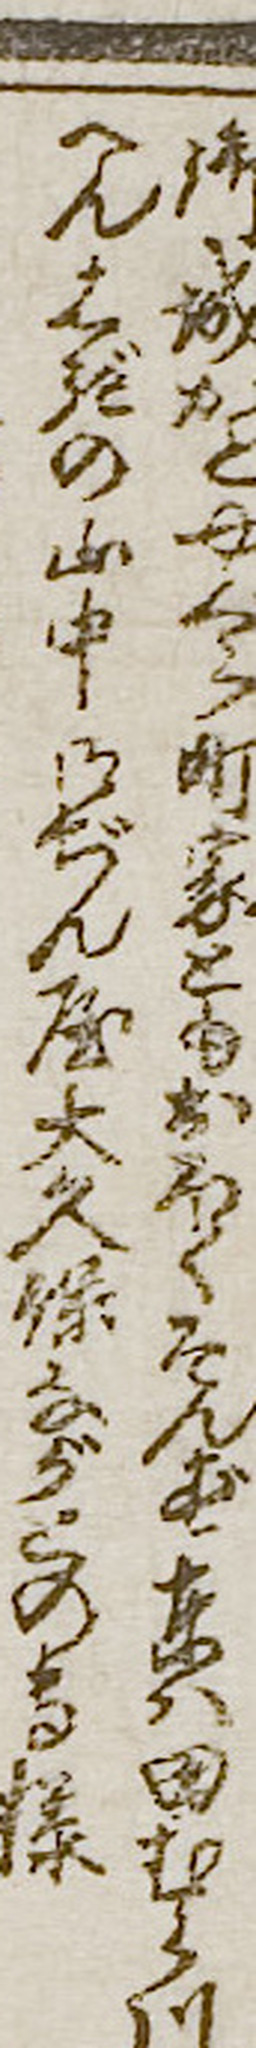へんはぎの山中御ぢん屋大久保ながとの守様
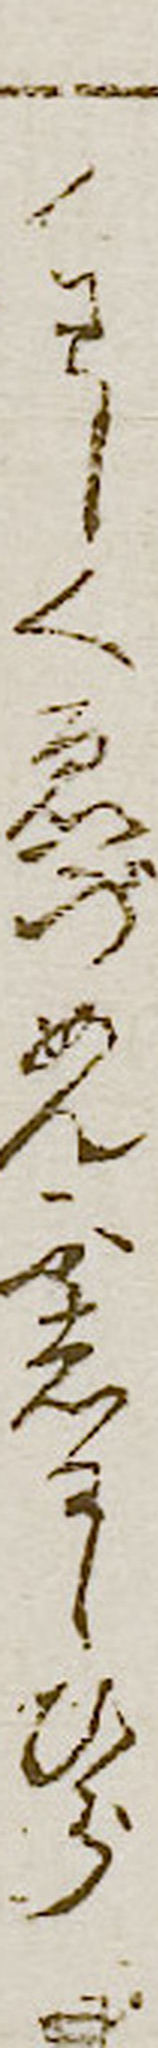くわしくゑづめんにしるしひら
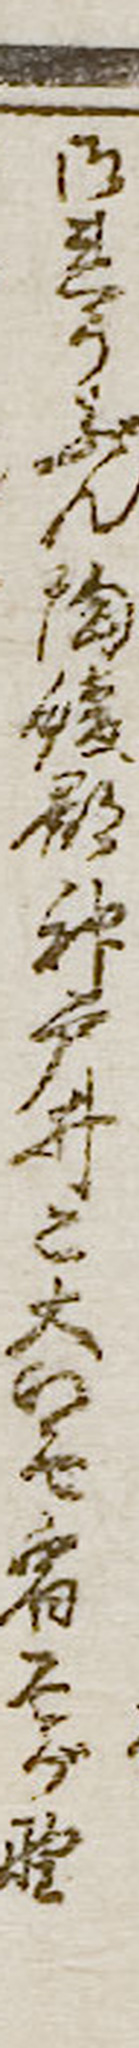御れうぶん陶綾郡神戸井こ大いそ宿そが野
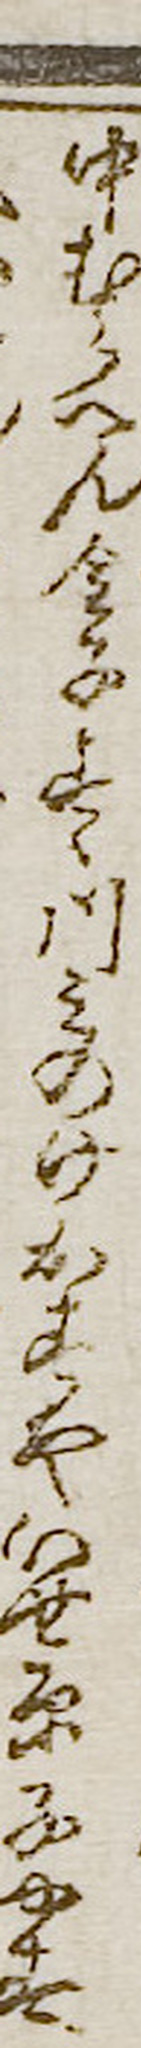中むらへん金子すゝ川みのけかすやいせ原子やす
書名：伊豆下田小田原箱根大地震之図
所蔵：東京大学総合図書館 General Library in the University of Tokyo, JAPAN
